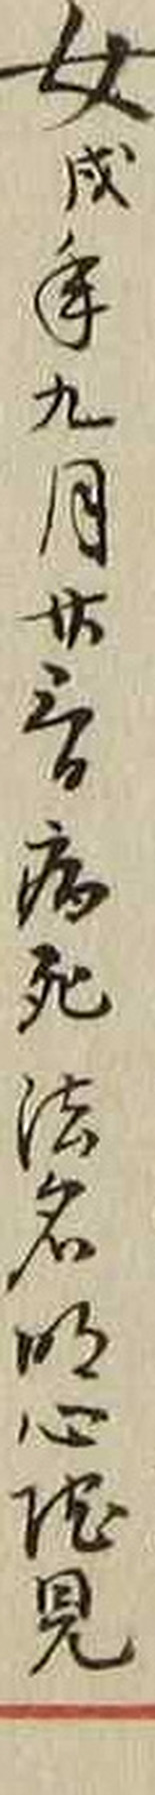戌年九月廿三日病死法名明心院見
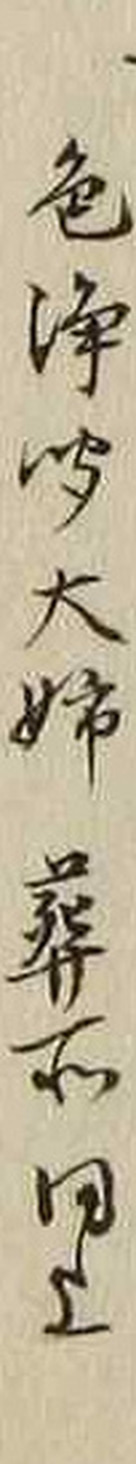色浄聞大婦葬所同上
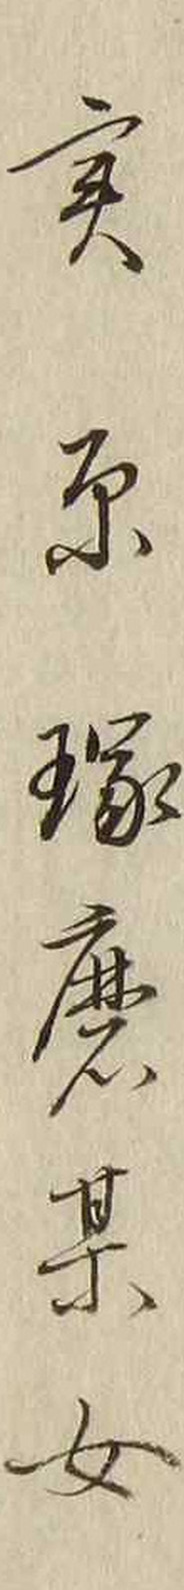実原琢磨其女

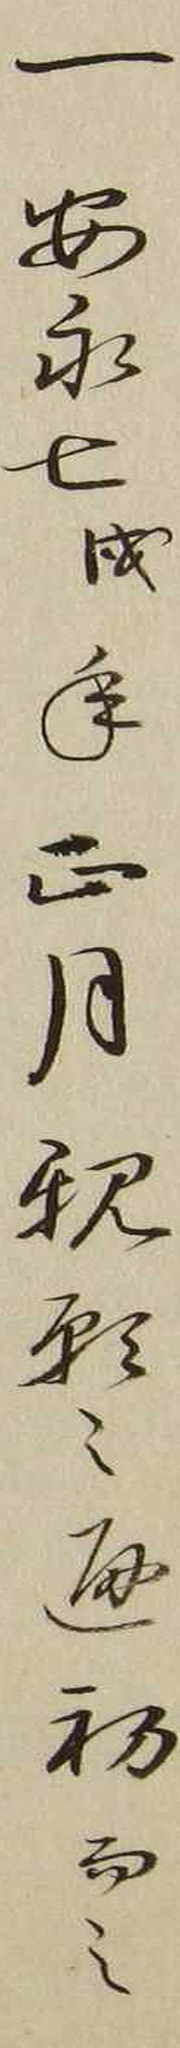一安永七戌年正月親願之通初而之
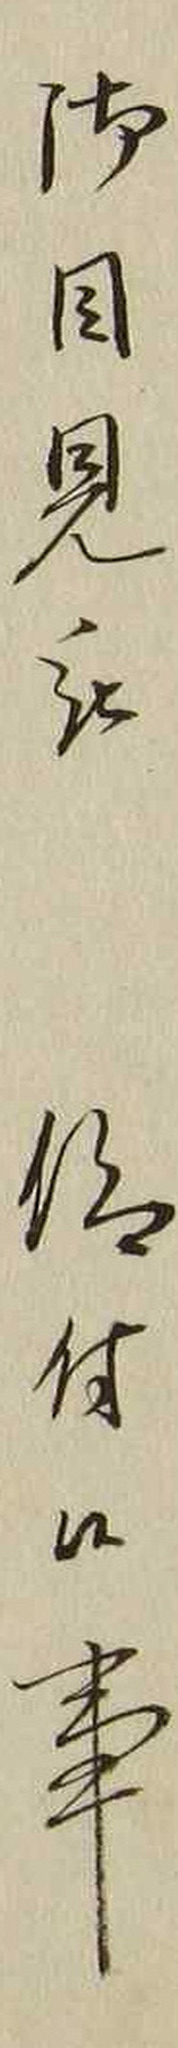御目見被仰付候事
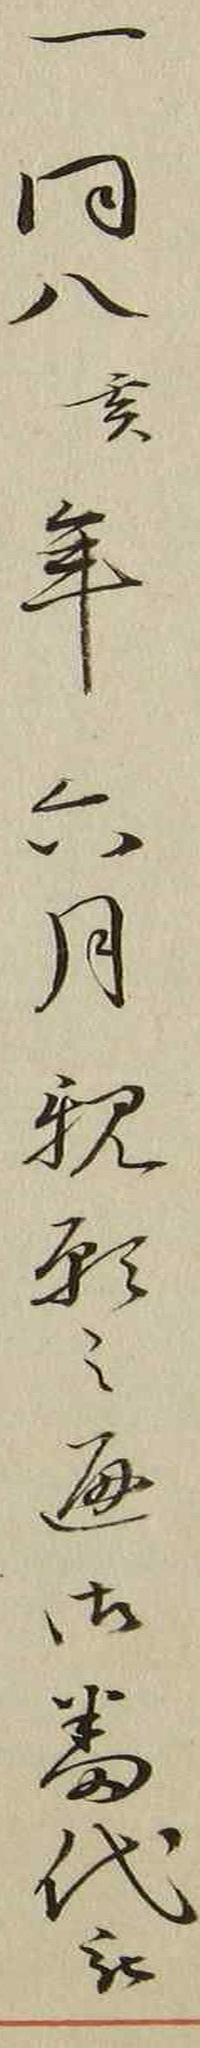一同八亥年六月親願之通御番代被
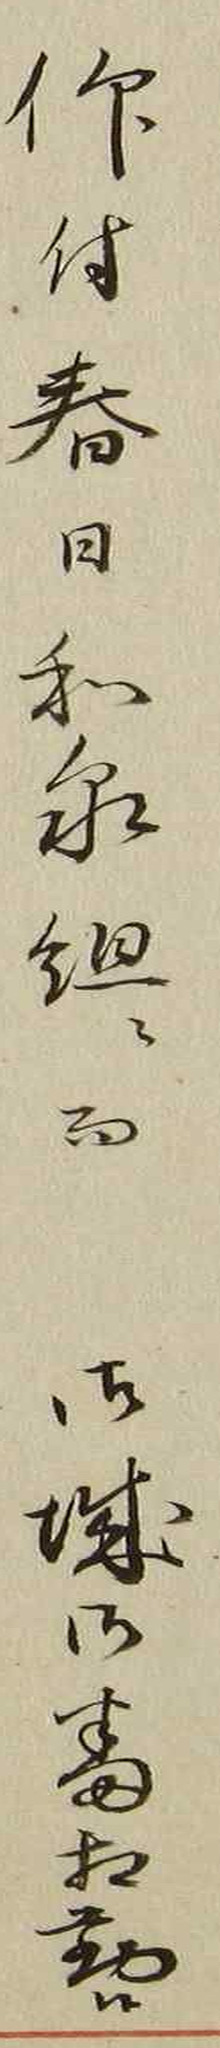仰付春日和泉組ニ而御城御番相勤候
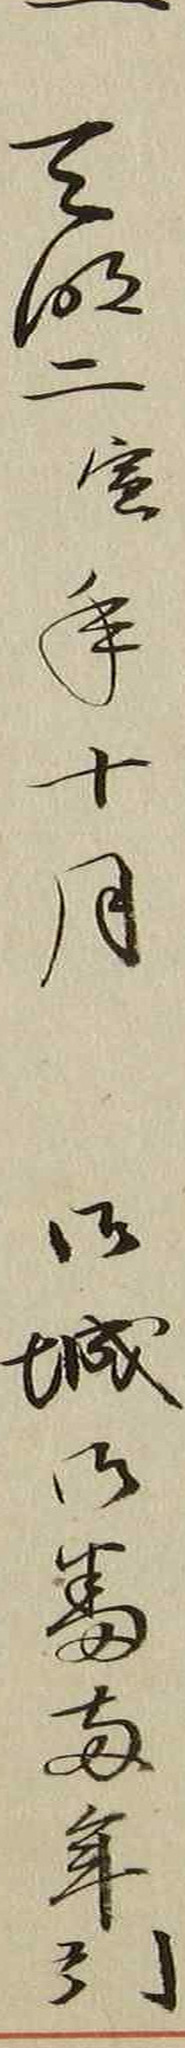一天明二寅年十月御城御番両年引
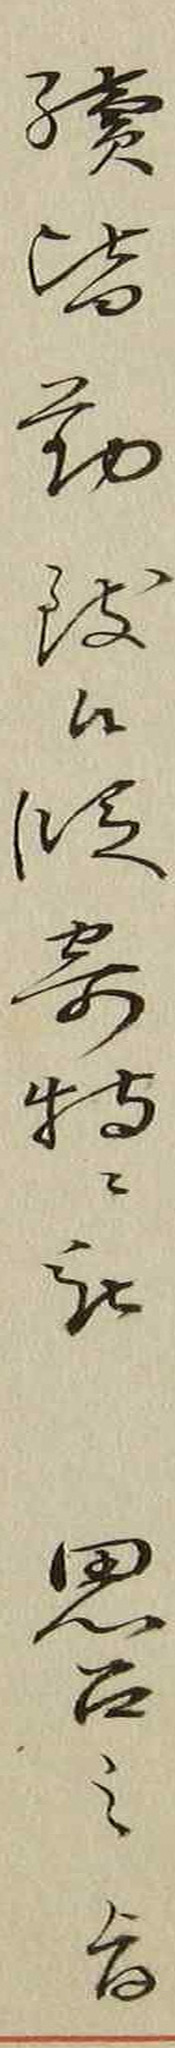続皆勤致候段寄特ニ被思召之旨
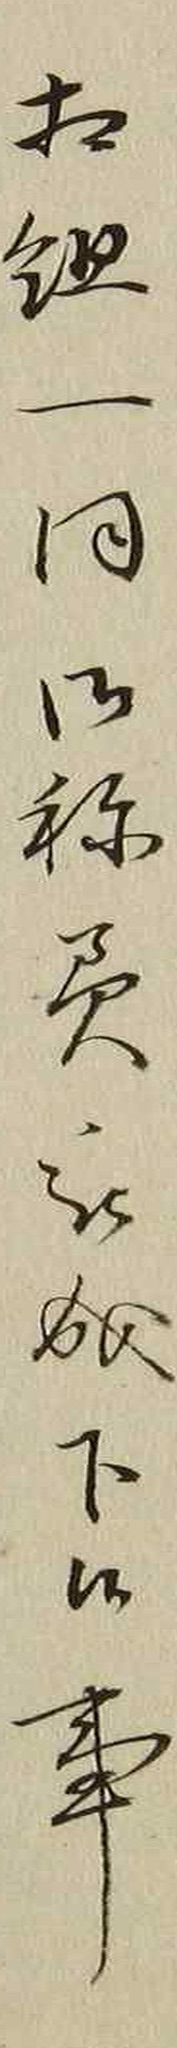相組一同御称美被成下候事
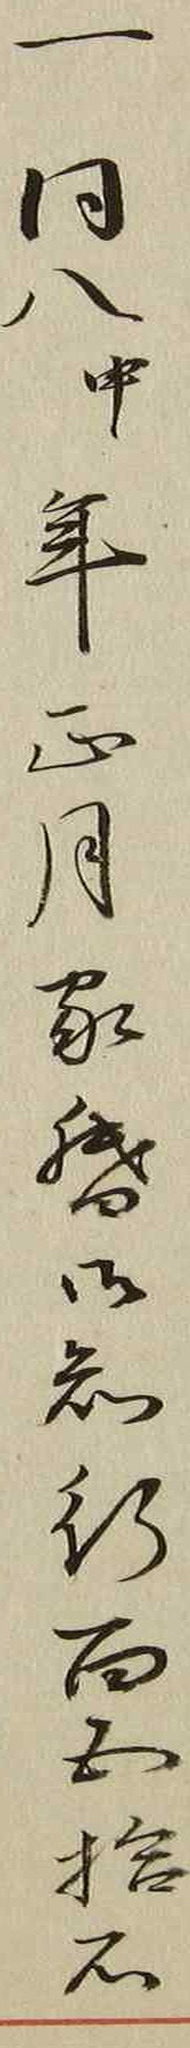一同八申年正月家督御知行百五拾石
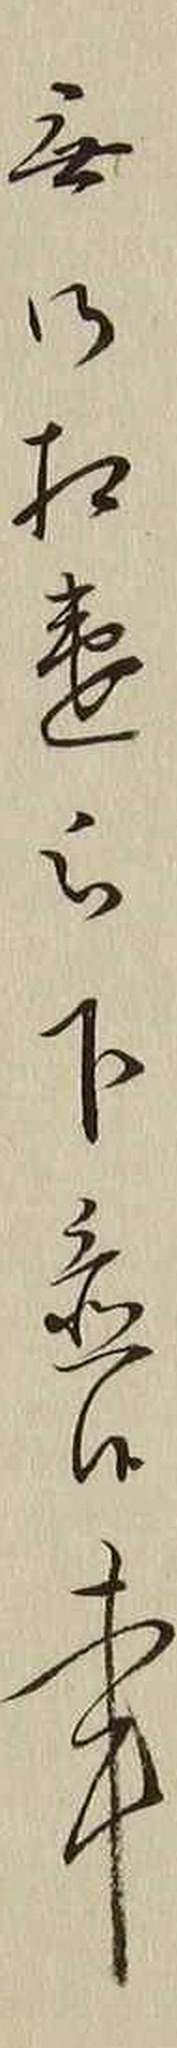無御相違被下置候事
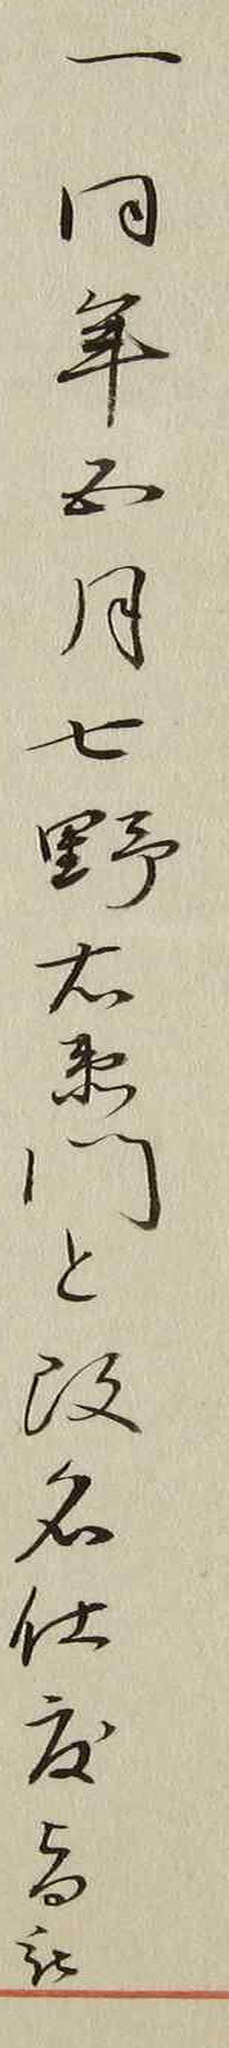一同年五月七野右衛門と改名仕度旨被
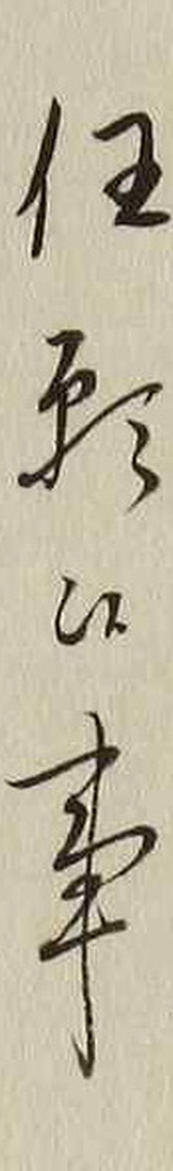任願候事
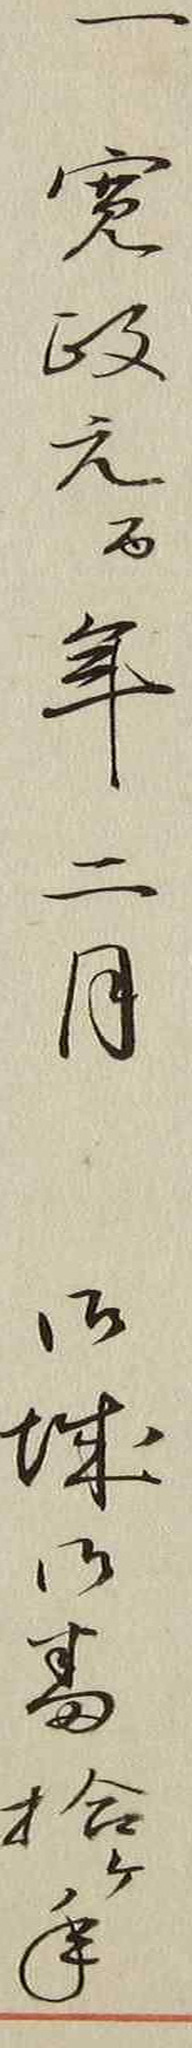一寛政元酉年二月御城御番拾ケ年
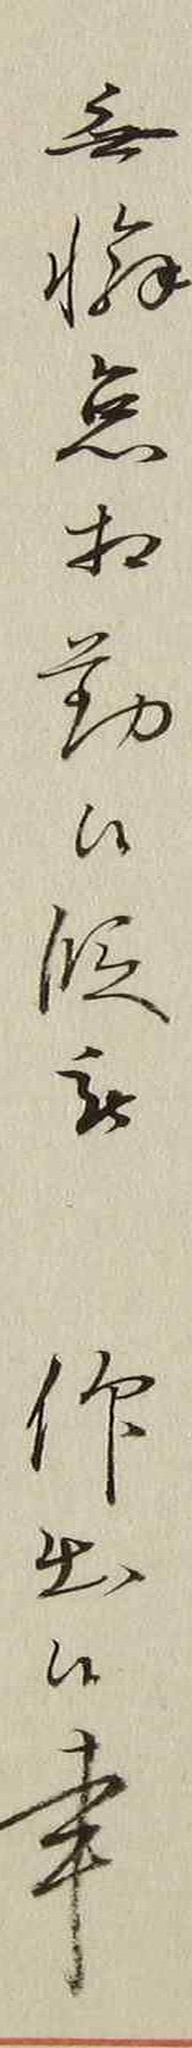無懈怠相勤候段被仰出候事
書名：諸士系譜　巻之22　い之部22
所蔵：会津若松市立会津図書館
